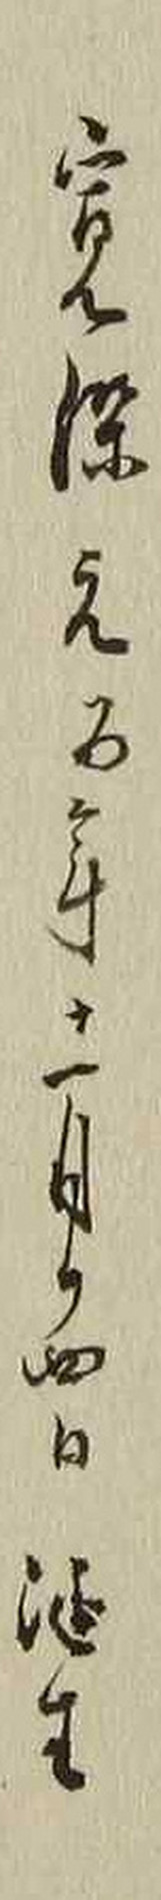寛保元酉年十一月十四日誕生
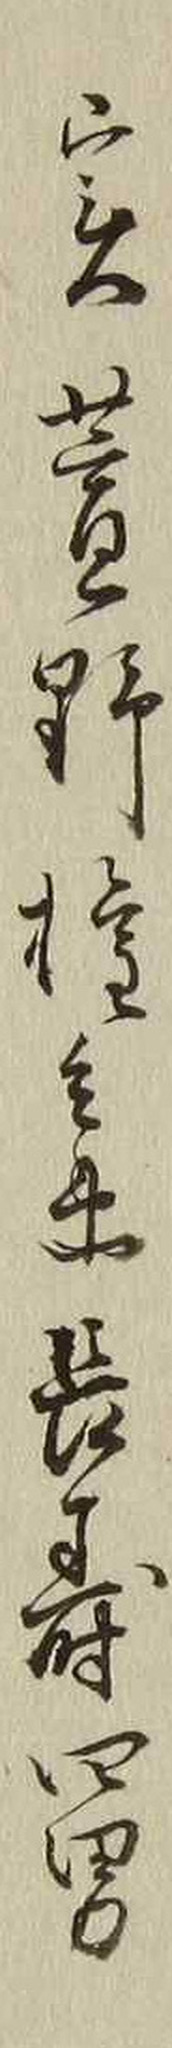実萱野権兵衛長寿四男
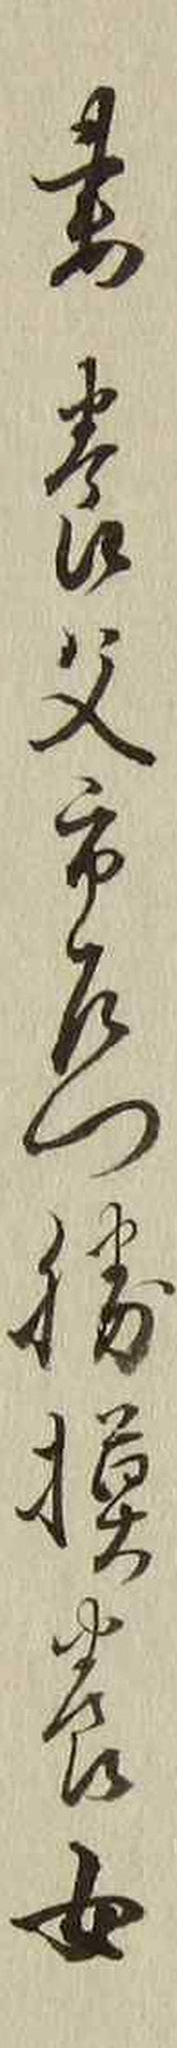妻養父市左衛門勝模養女
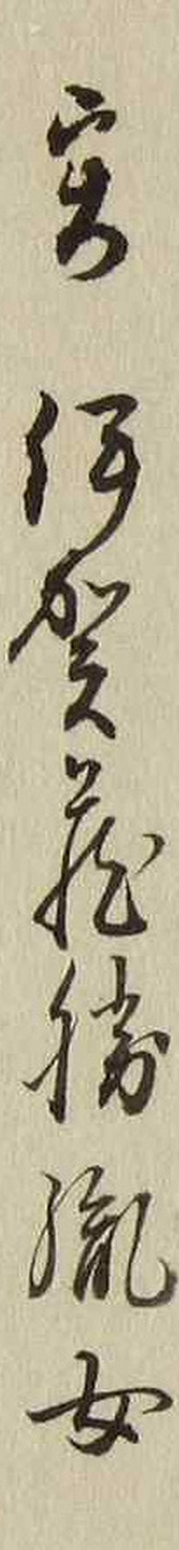実伊賀蔵勝胤女
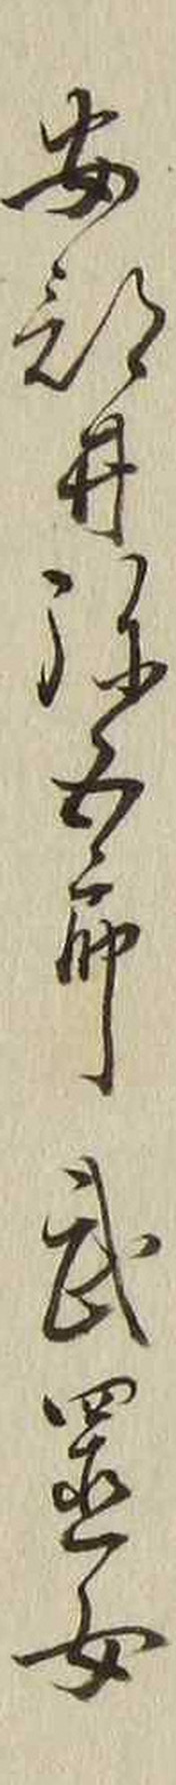安部井弥五郎武置女

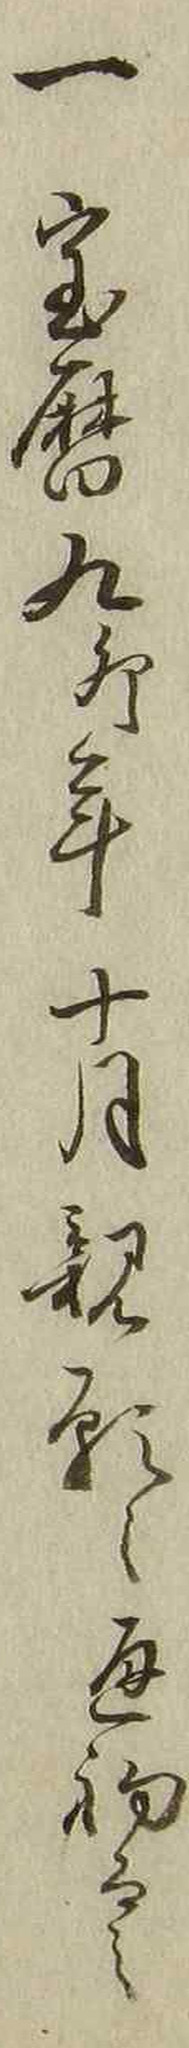一宝暦九卯年十月親願い之通初めて之
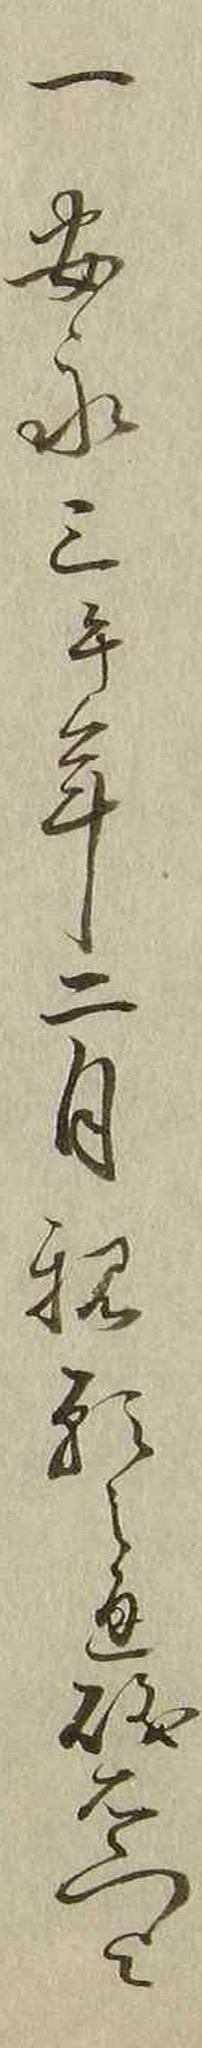一安永三午年二月親願い之通磯右衛門と
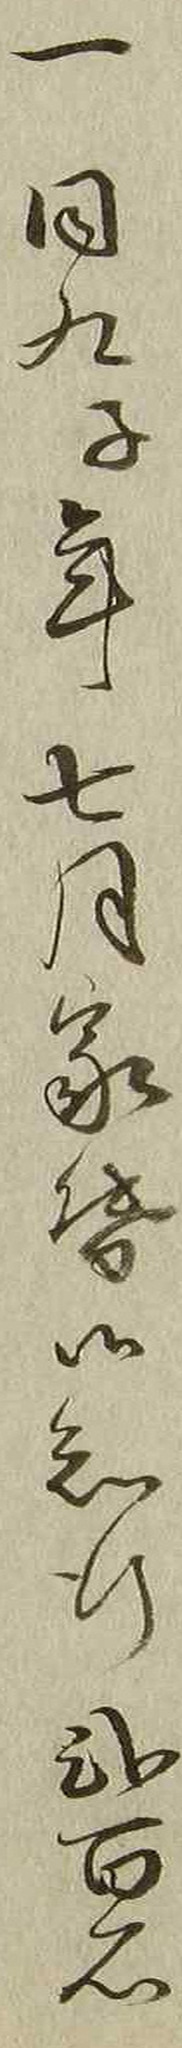一同九子年七月家督御知行弐百石
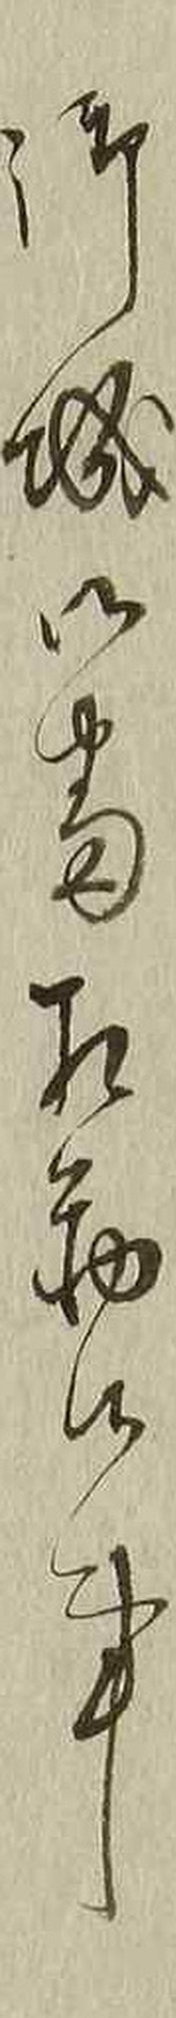御城御番相勤め候事
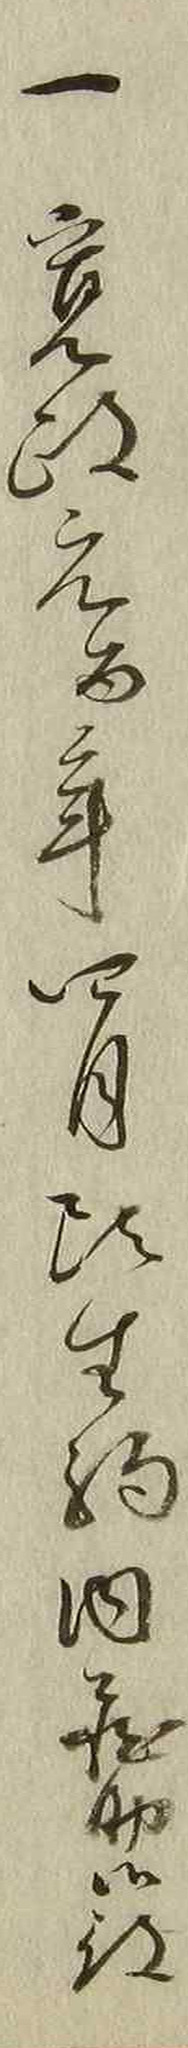一寛政元酉年四月生駒内蔵助御役
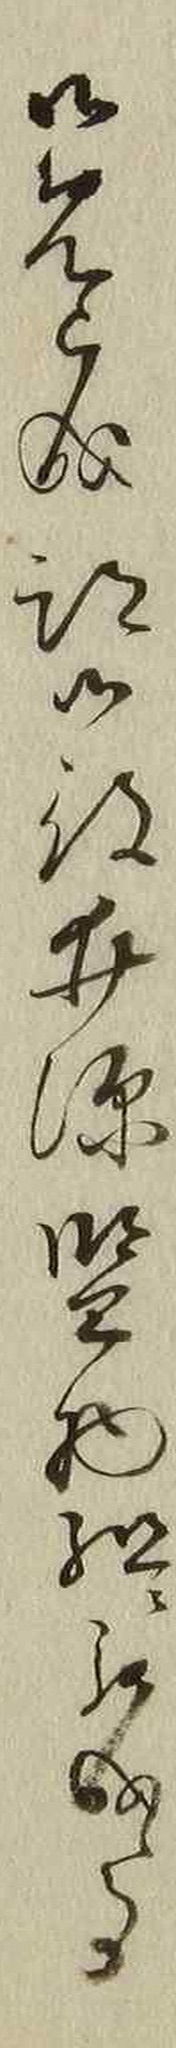御免成られ跡御役井深監物組ニ罷り成り候事
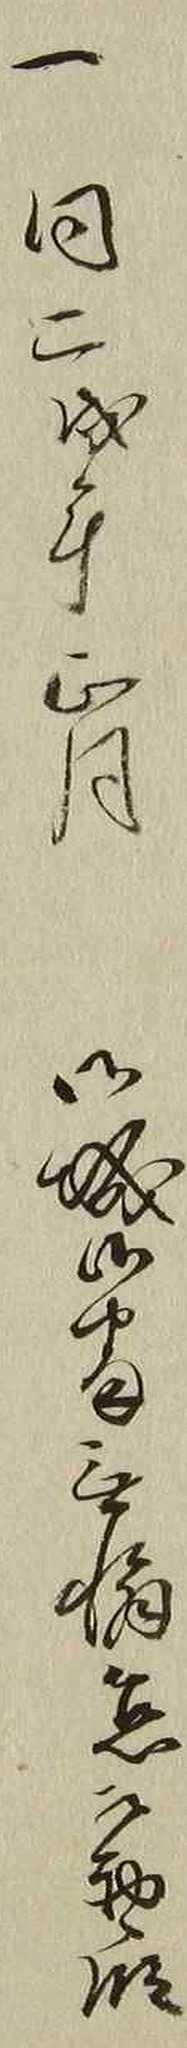一同二戌年正月御城御番懈怠無く勤められ候段
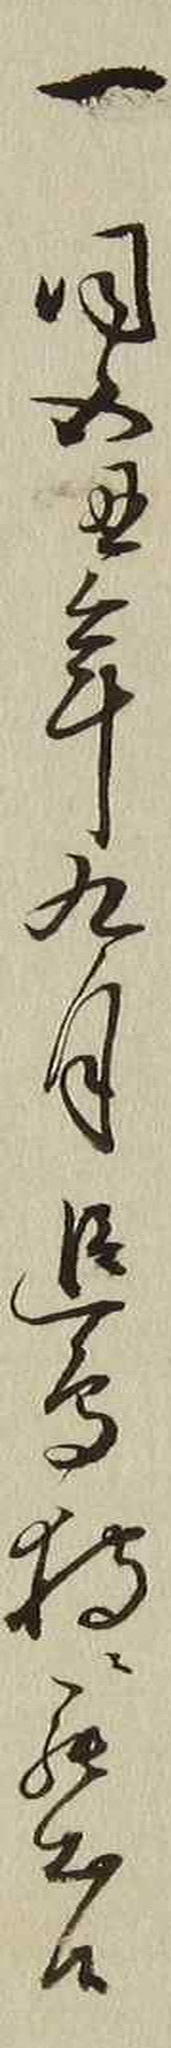一同五丑年九月追鳥狩ニ罷り出で候
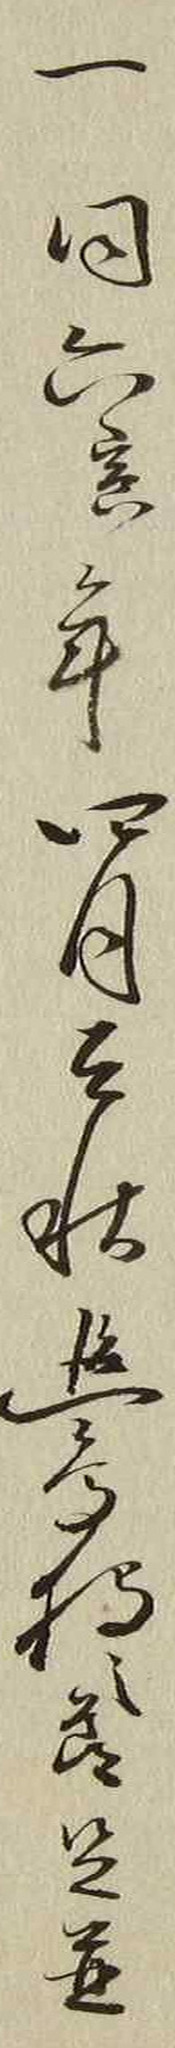一同六寅年四月去る秋追鳥狩之節足並
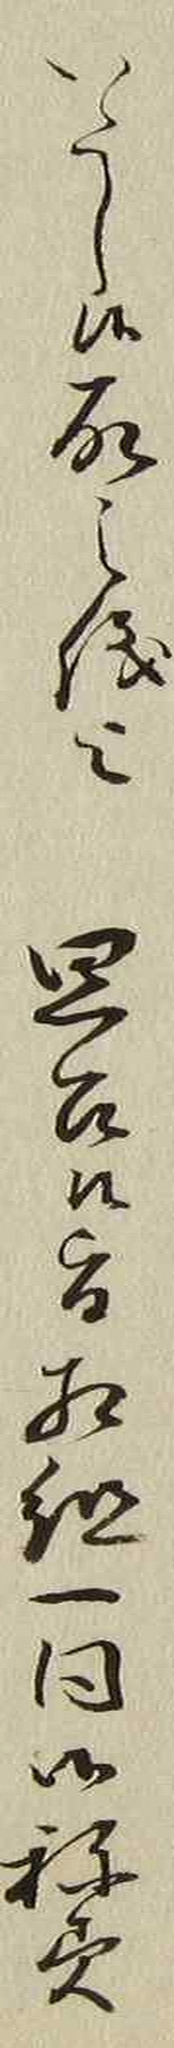いたし候故之義と思召し候旨相組一同御称美
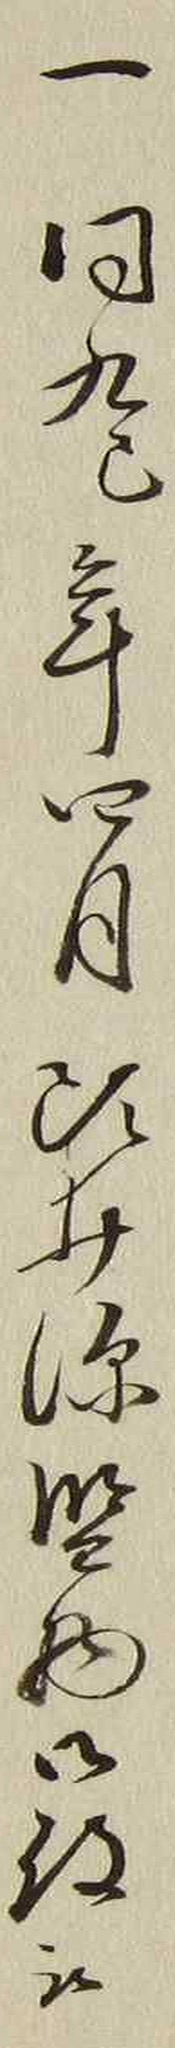一同九巳年四月頭井深監物御役
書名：諸士系譜　巻之20　い之部20
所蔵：会津若松市立会津図書館
